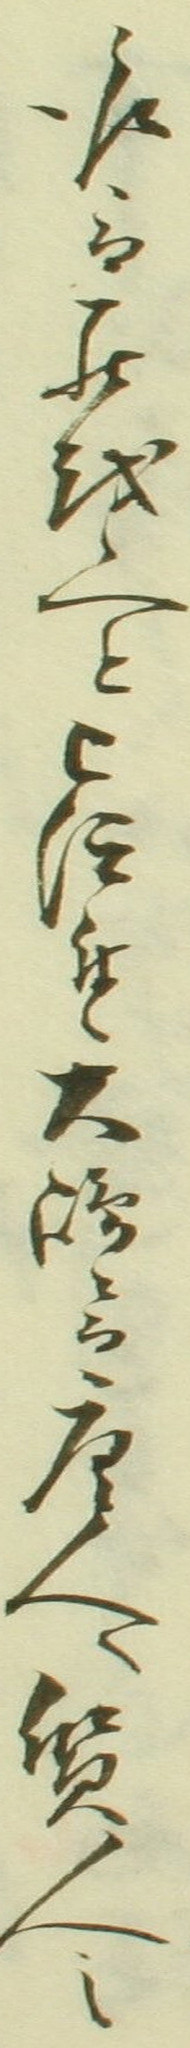取候て罷越候へと被仰付候大島にて唐人へ質人之
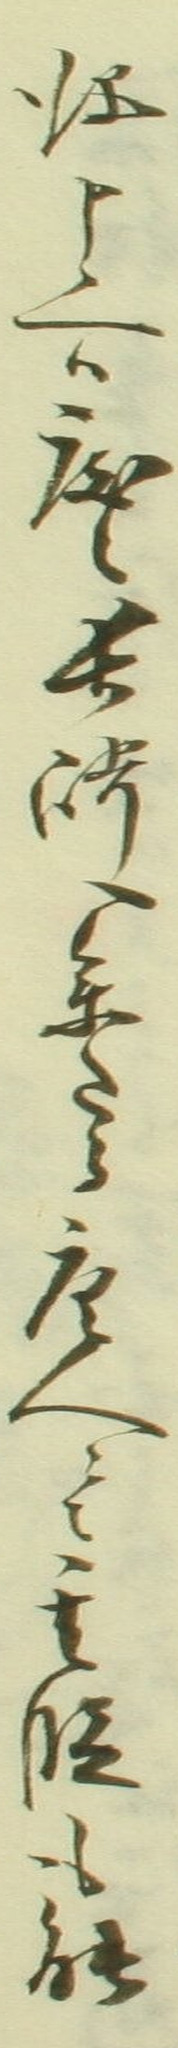儀申候へは度々長崎へ参たる唐人にて其段も能
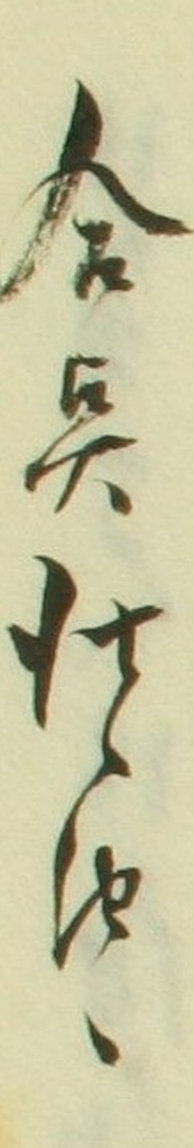合点仕候由候
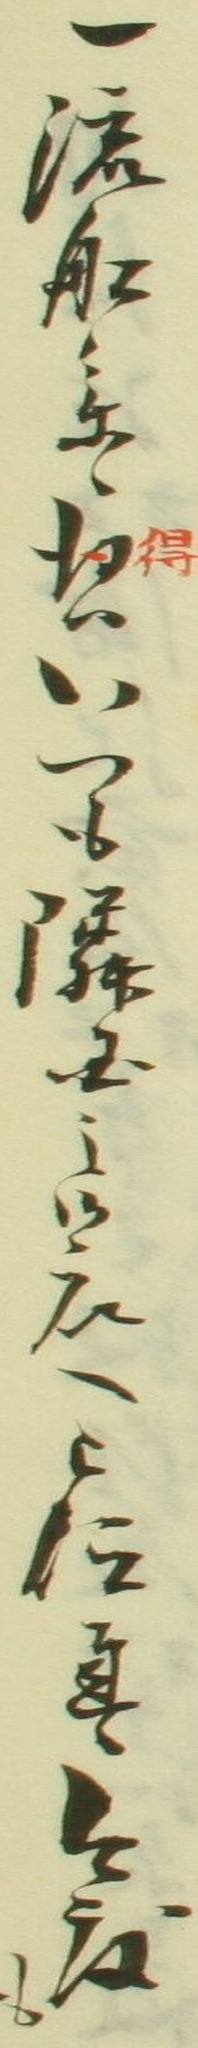一流船参候得はいつも隣国之御衆へ被仰達候今度も

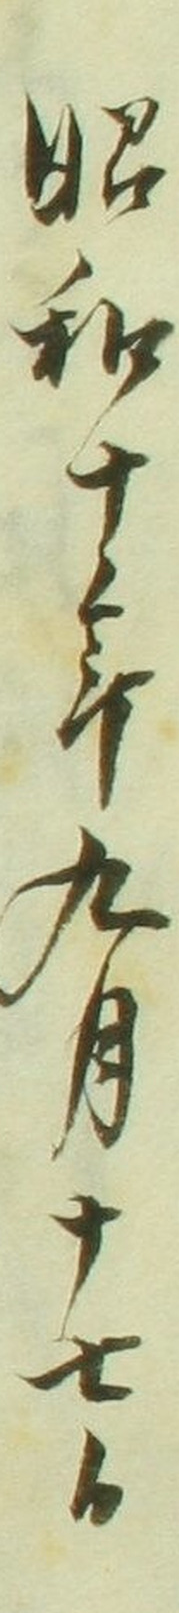昭和十年九月十七日
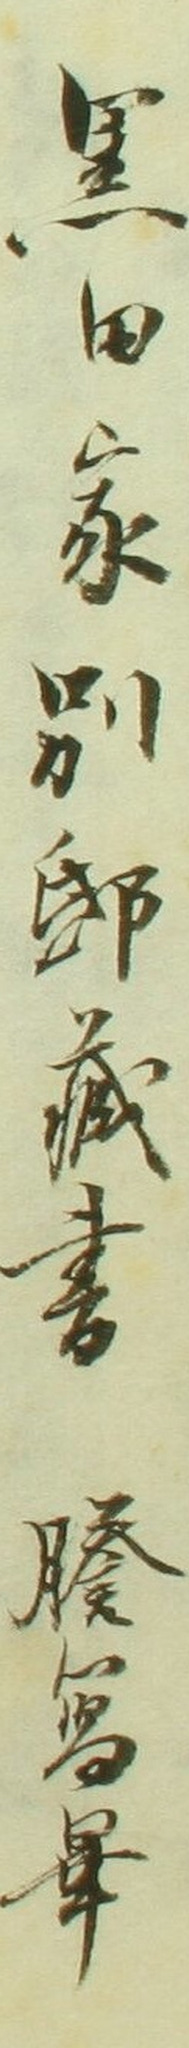黒田家別邸蔵書謄写畢
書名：異国船漂着記
